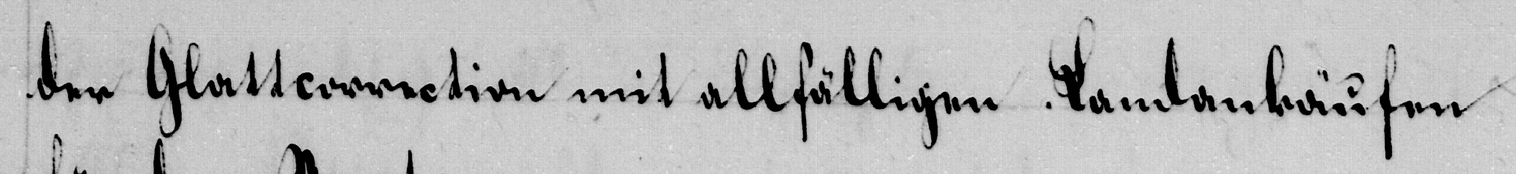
der Glattcorrection mit allfälligen Landankäufen
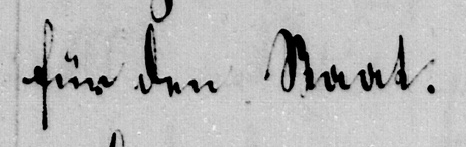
für den Staat.
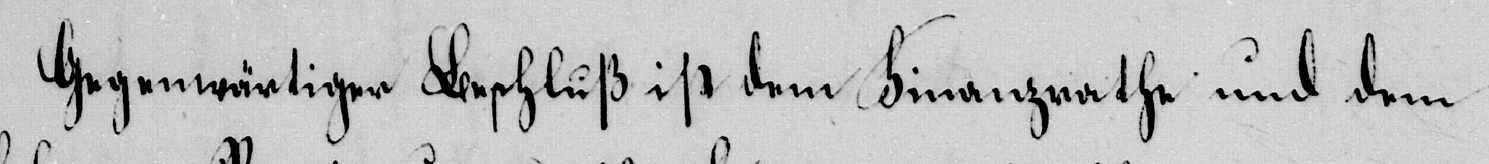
Gegenwärtiger Beschluß ist dem Finanzrathe und dem
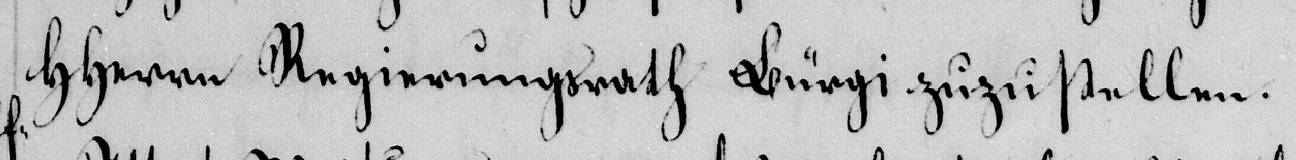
HHerrn Regierungsrath Bürgi zuzustellen.
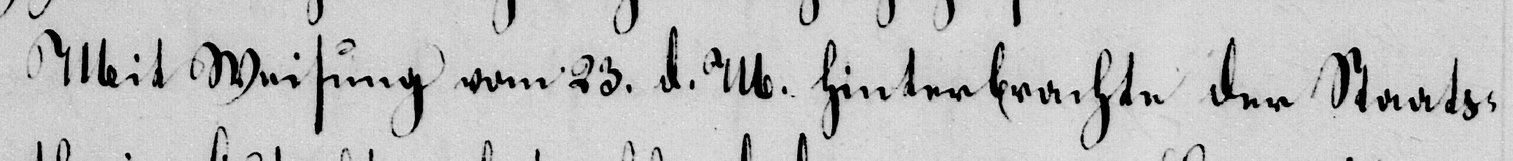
Mit Weisung vom 23. d. M. hinterbrachte der Staats¬
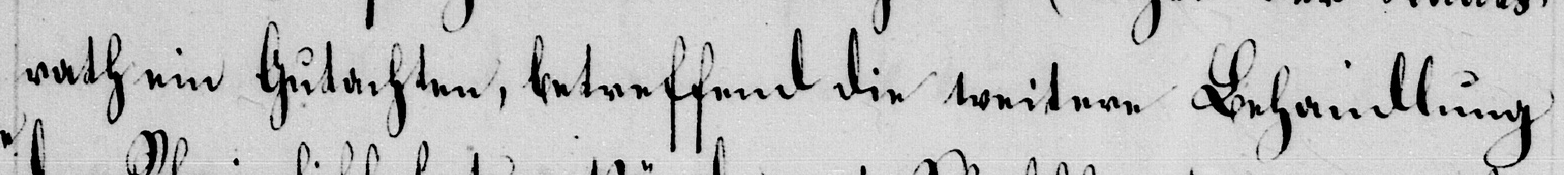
rath ein Gutachten, betreffend die weitere Behandlung
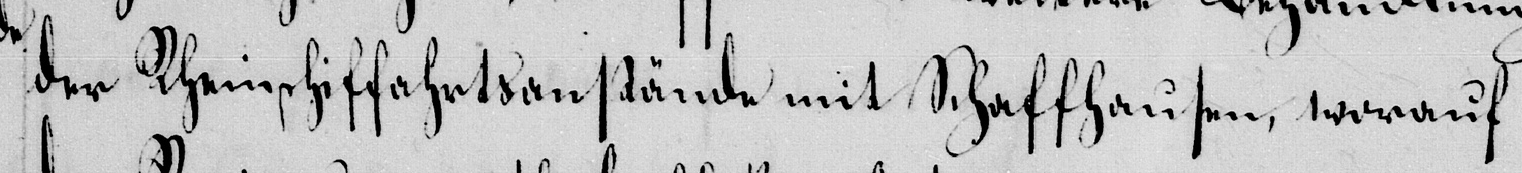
der Rheinschiffahrtsanstände mit Schaffhausen, worauf
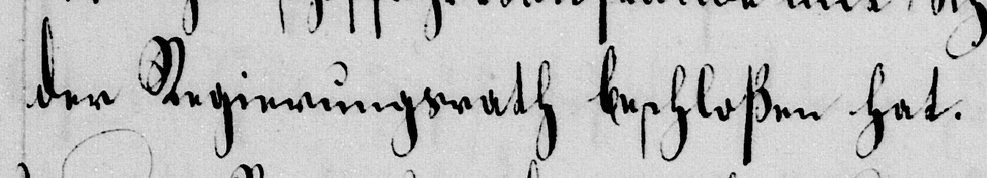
der Regierungsrath beschloßen hat.
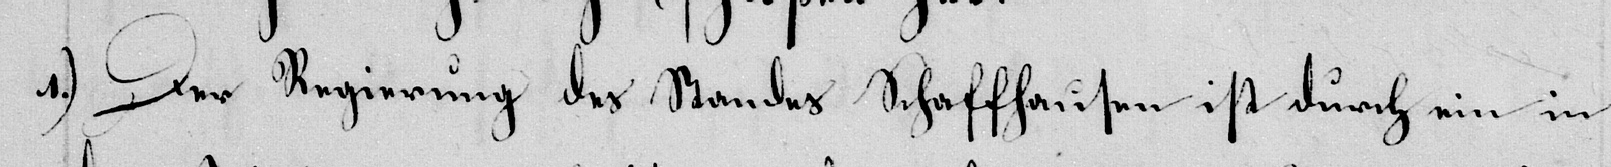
1.) Der Regierung des Standes Schaffhausen ist durch ein in
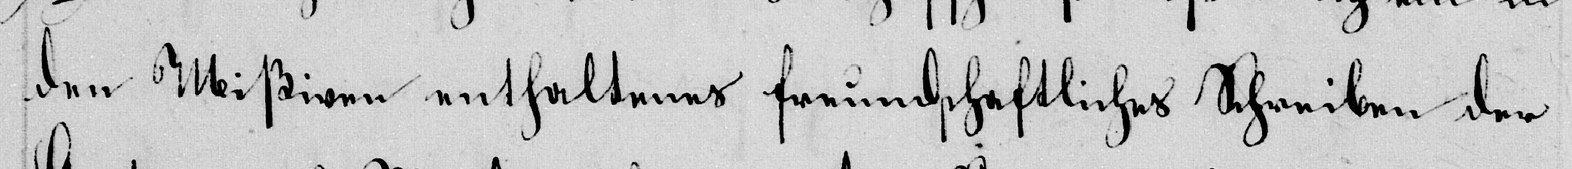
den Mißiven enthaltenes freundschaftliches Schreiben der
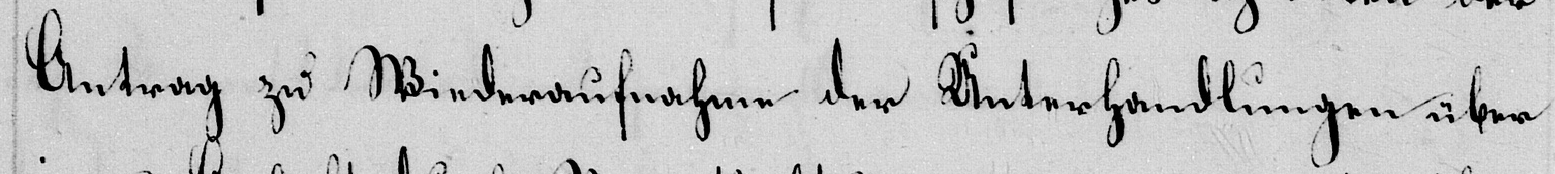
Antrag zu Wiederaufnahme der Unterhandlungen über
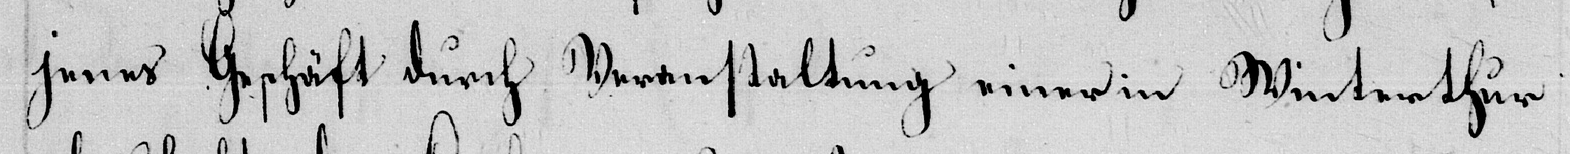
jenes Geschäft durch Veranstaltung einer in Winterthur
